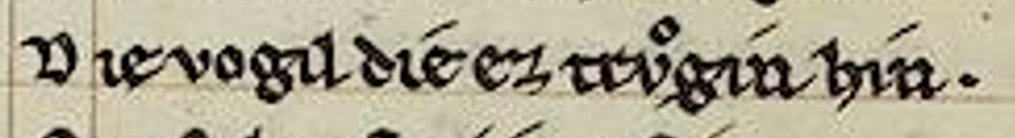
Die vogel die ez trv°ogin hin.
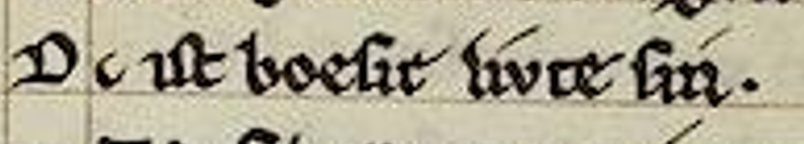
D(az) iſt boeſir livte ſin.
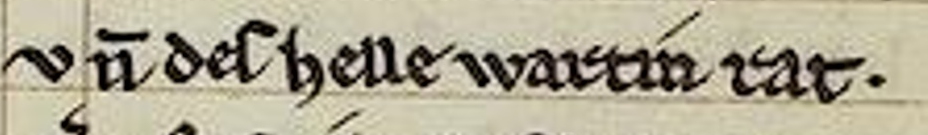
Vn(d) deſ helle wartin rat.
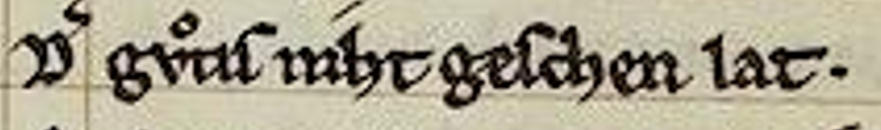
D(er) gv°otiſ niht geſchen lat.
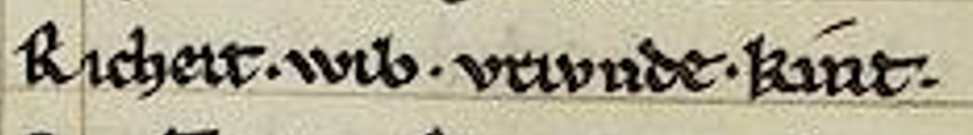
Richeit. wib. vrivnde. kint.
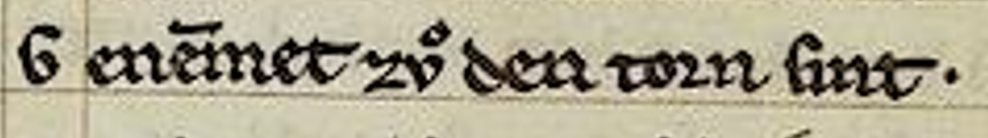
Gene(m)met zv°o den torn ſint.
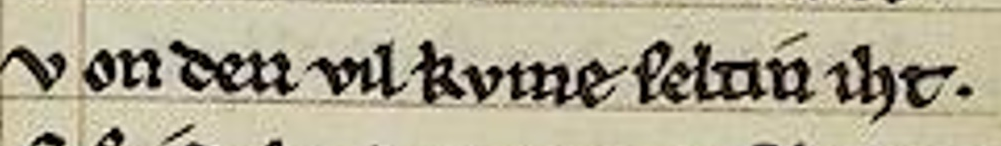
Von den vil kvme ſeltin iht.
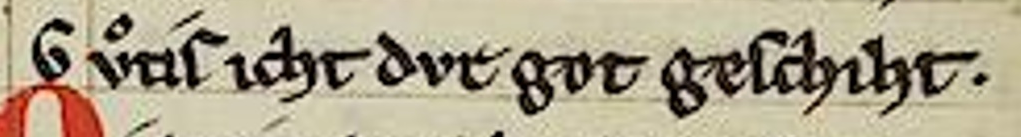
Gv°otiſ icht dvr got geſchiht.
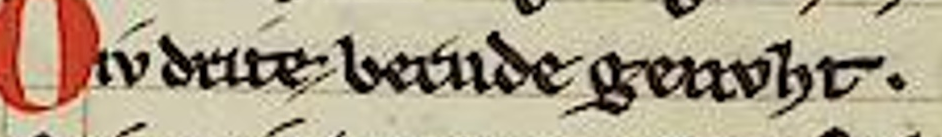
*D(iv) drite bernde genvht.
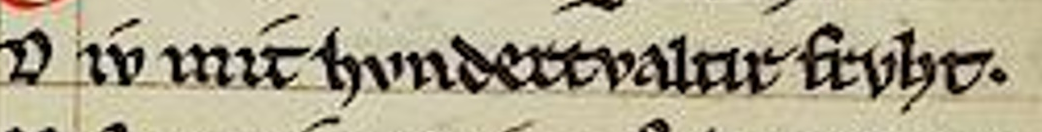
Div mit hvndertvaltir frvht.
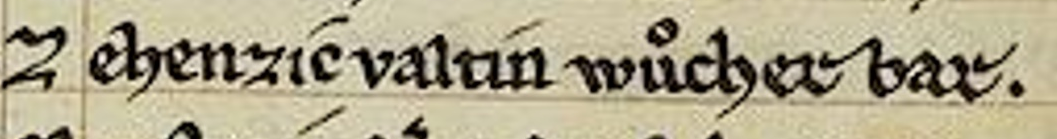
Zehenzic valtin wu°ocher bar.
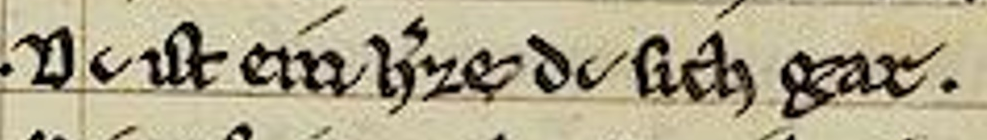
D(az) iſt ein h(er)ze d(az) ſich gar.
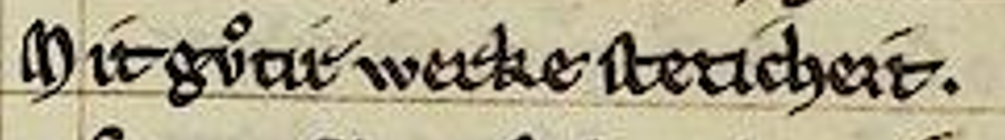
Mit gv°otir werke ſteticheit.
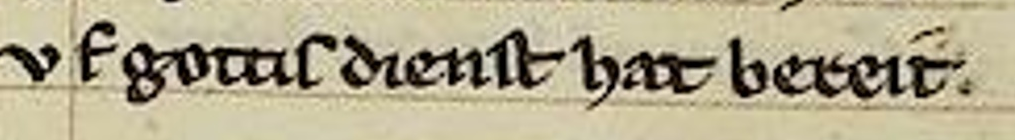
Vf gottiſ dienſt hat bereit.
